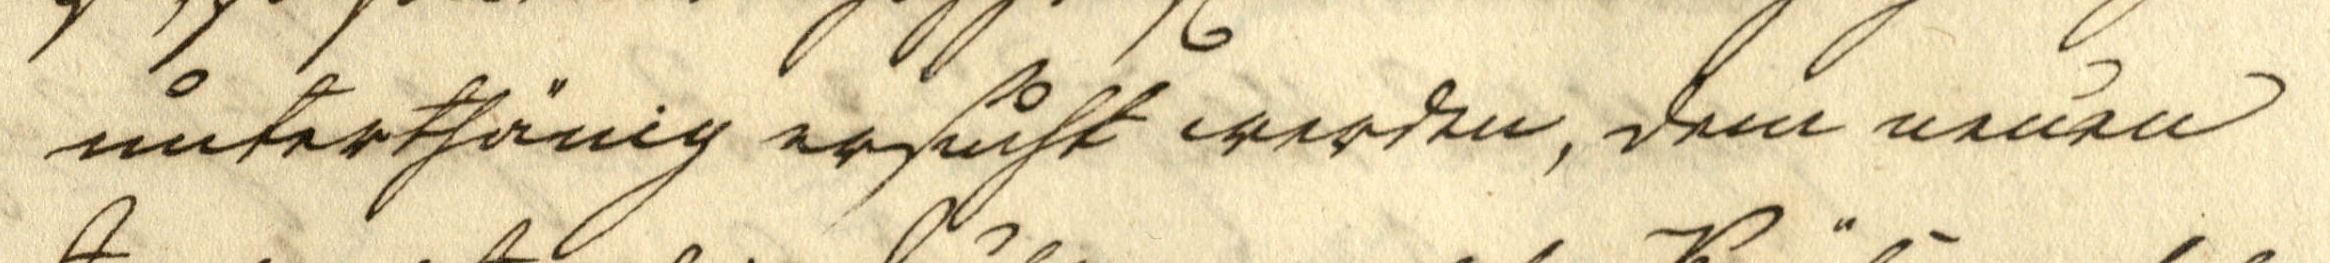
unterthänig ersucht werden, dem neuen
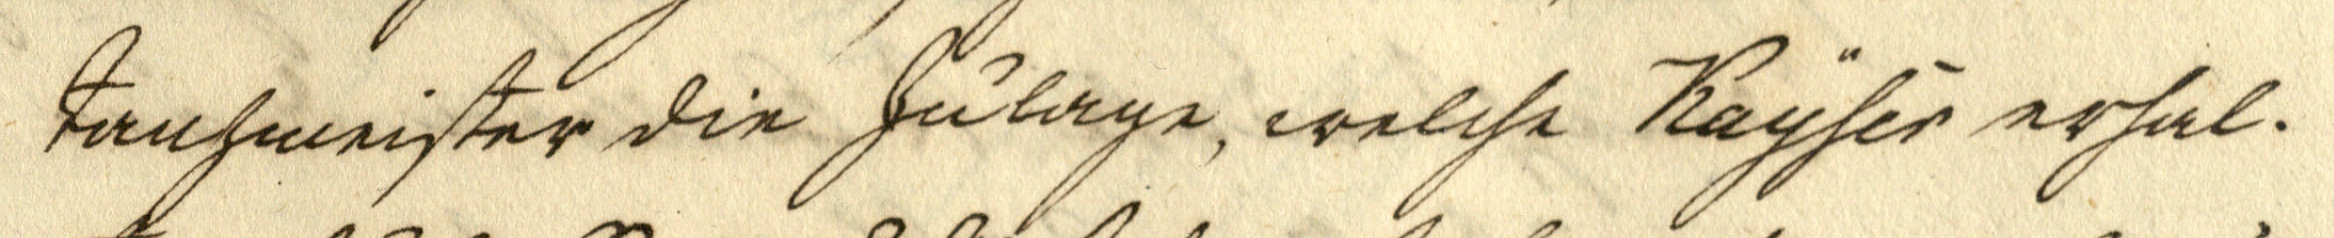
Tanzmeister die Zulage, welche Kayser erhal-
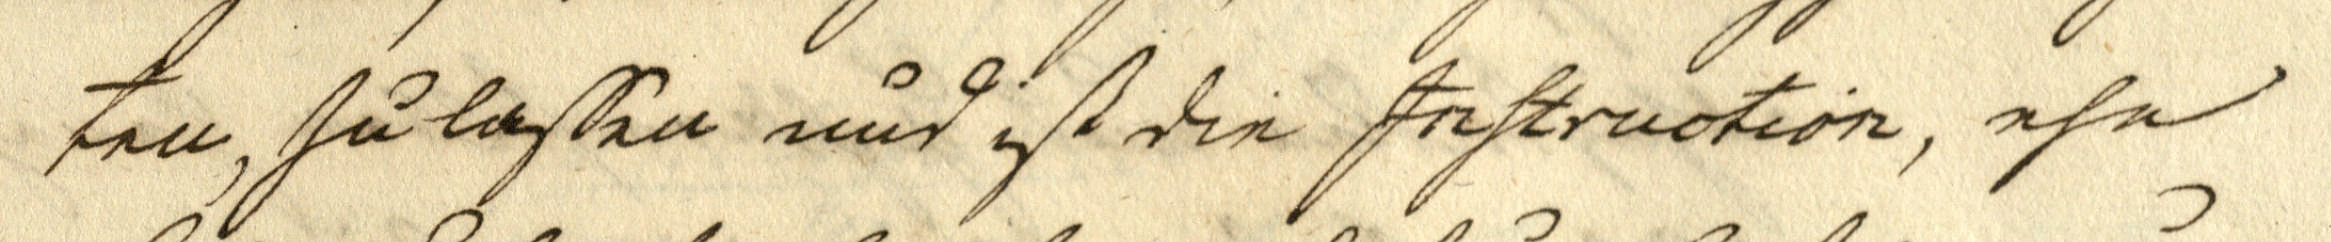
ten, zu lassen und ist die Instruction, ehe
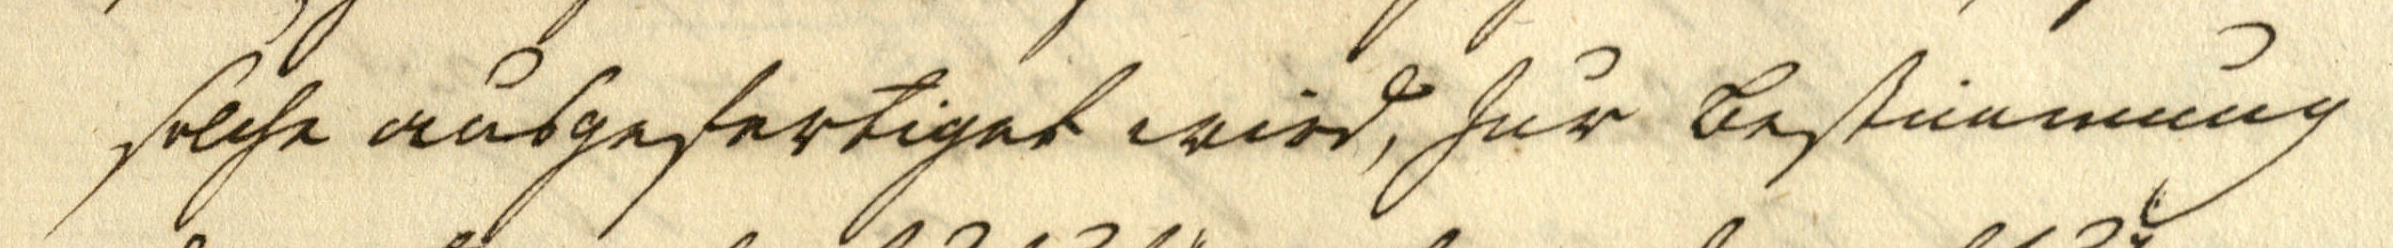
solche ausgefertiget werid, zur Bestimmung
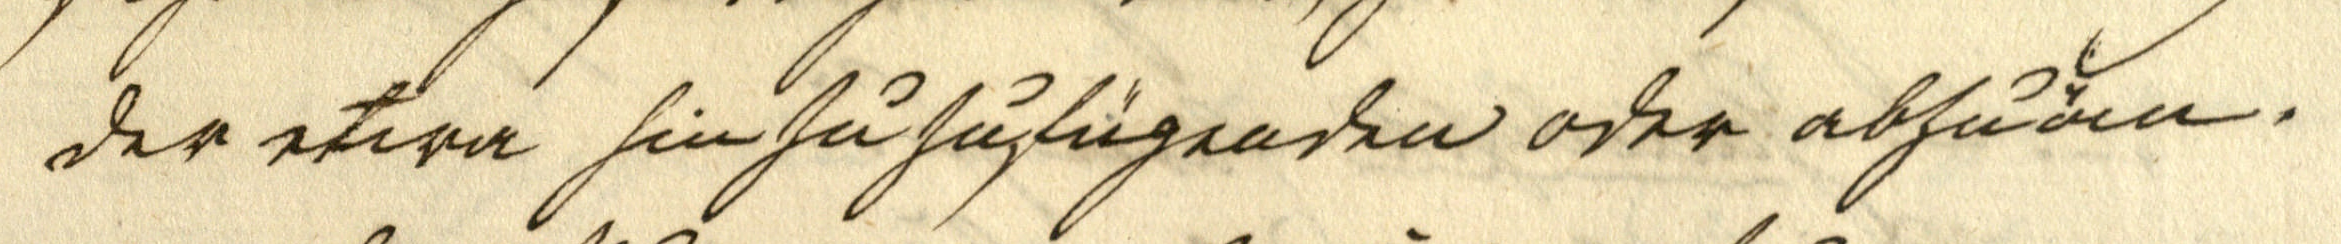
der etwa hinzuzufügenden oder abzuän-
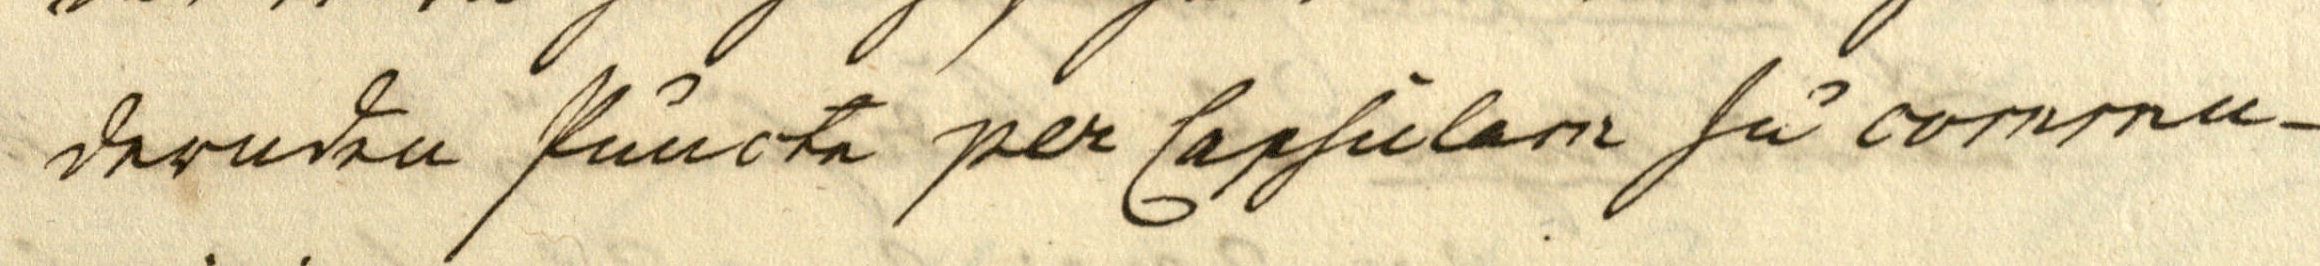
dernden Puncte per Capsulam zu commu-
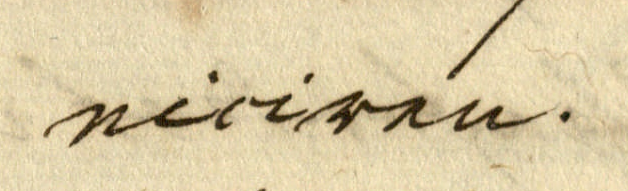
niciren.
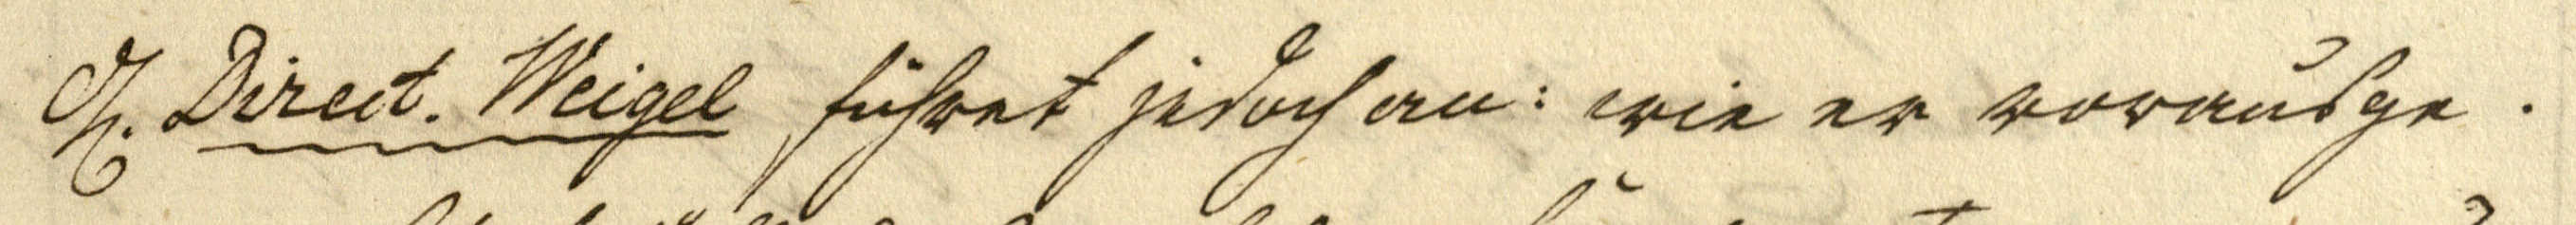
dh. Direct. Weigel führet jedoch an: wie er vorausge-
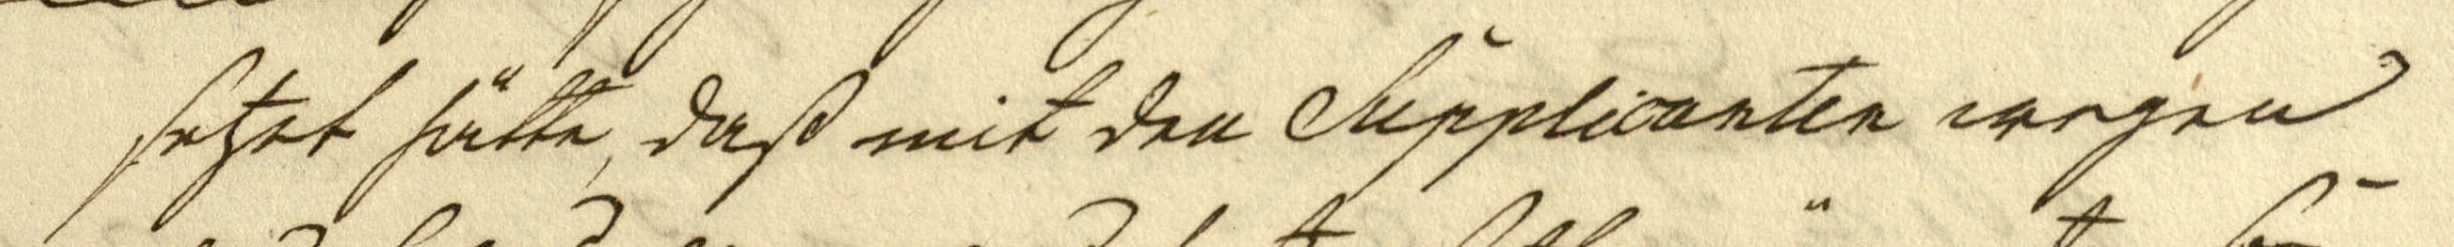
setzet hätte, daß mit den Supplicanten wegen
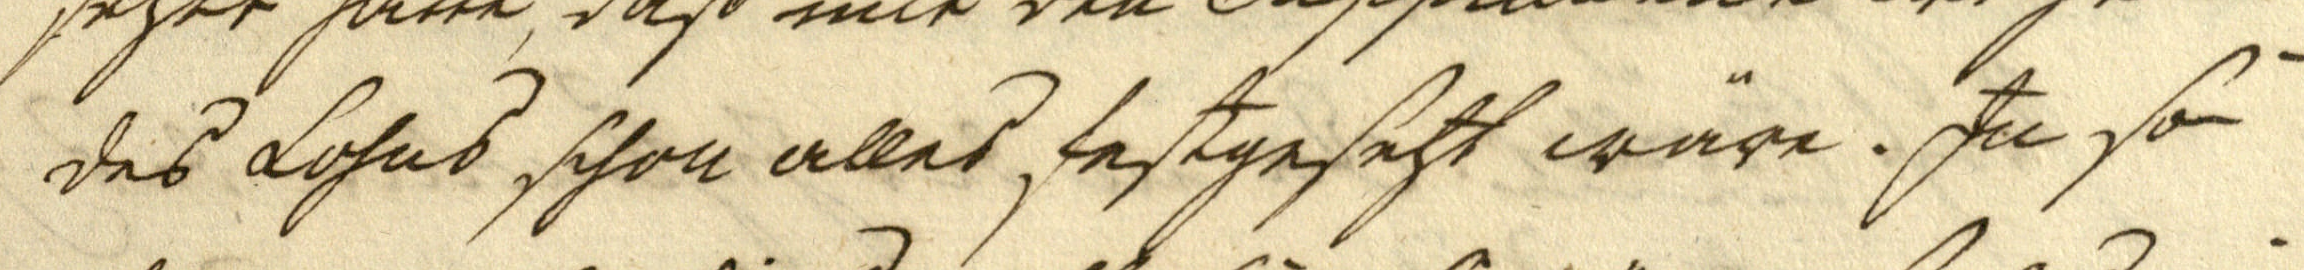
des Lohns schon alles festgesetzt wäre. In so-
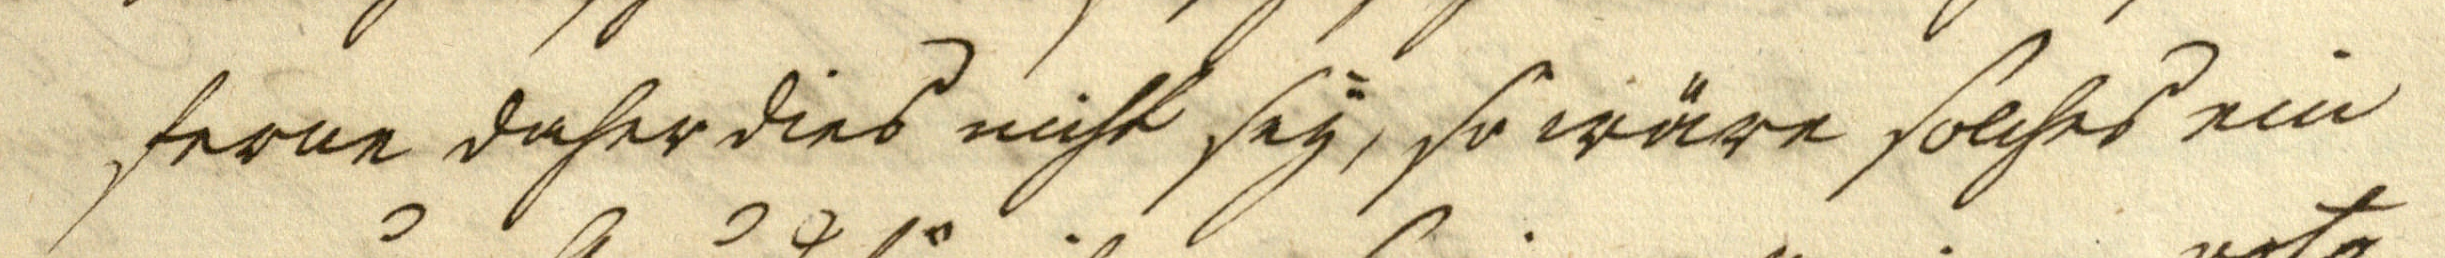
ferne daher dies nicht sey, so wäre solches ein
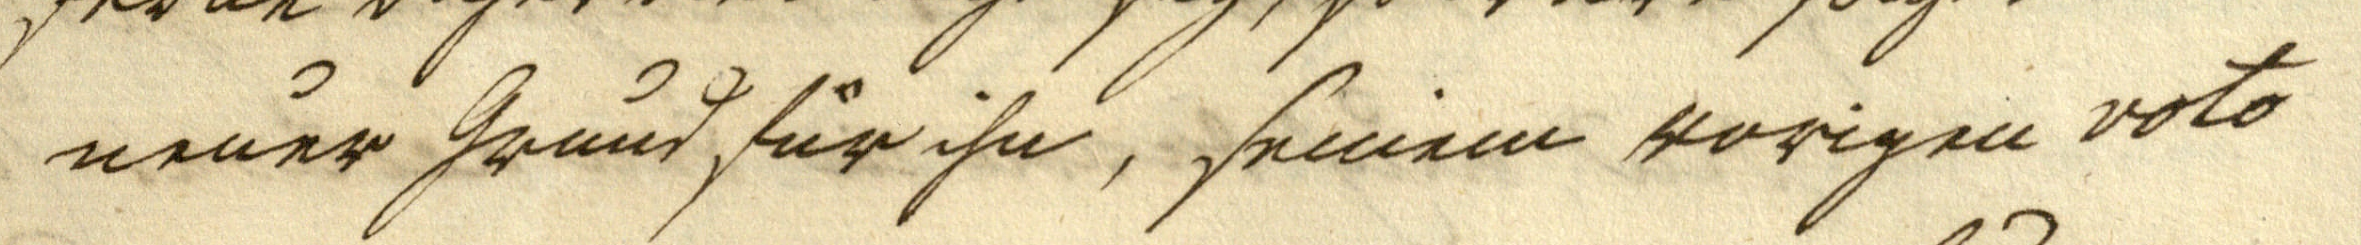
neuer Grund für ihn, seinem vorigen voto
